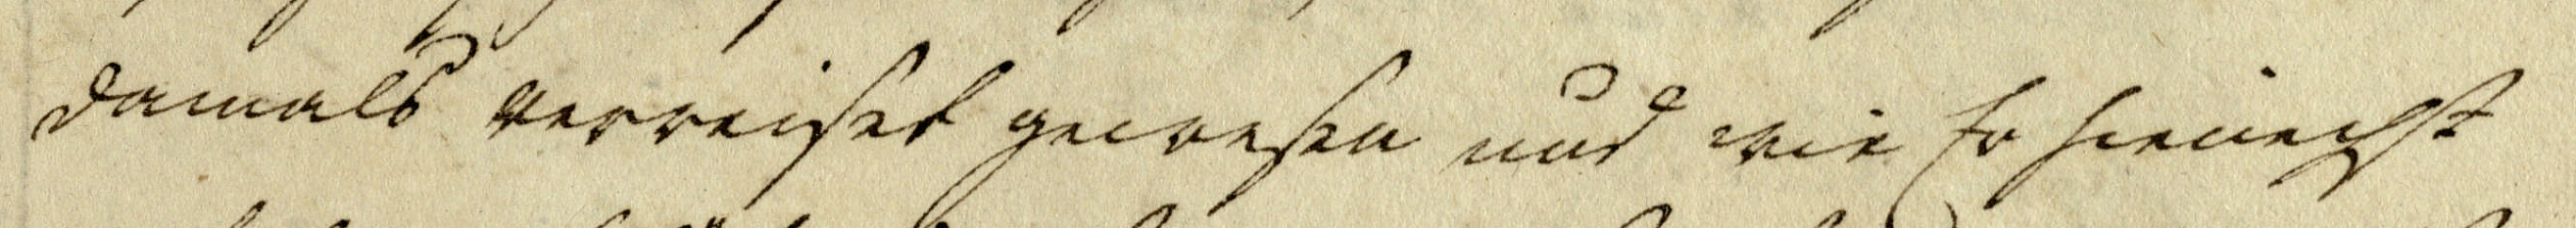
damahls verreiset gewesen und wie Er hienechst
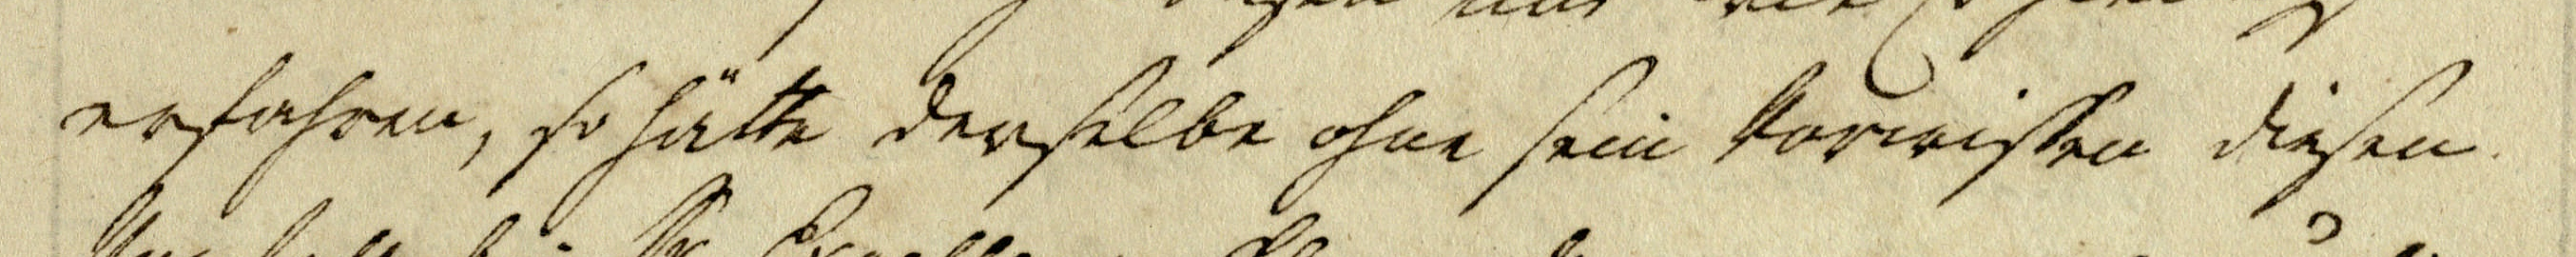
erfahren, so hätte derselbe ohne sein Vorwissen diesen
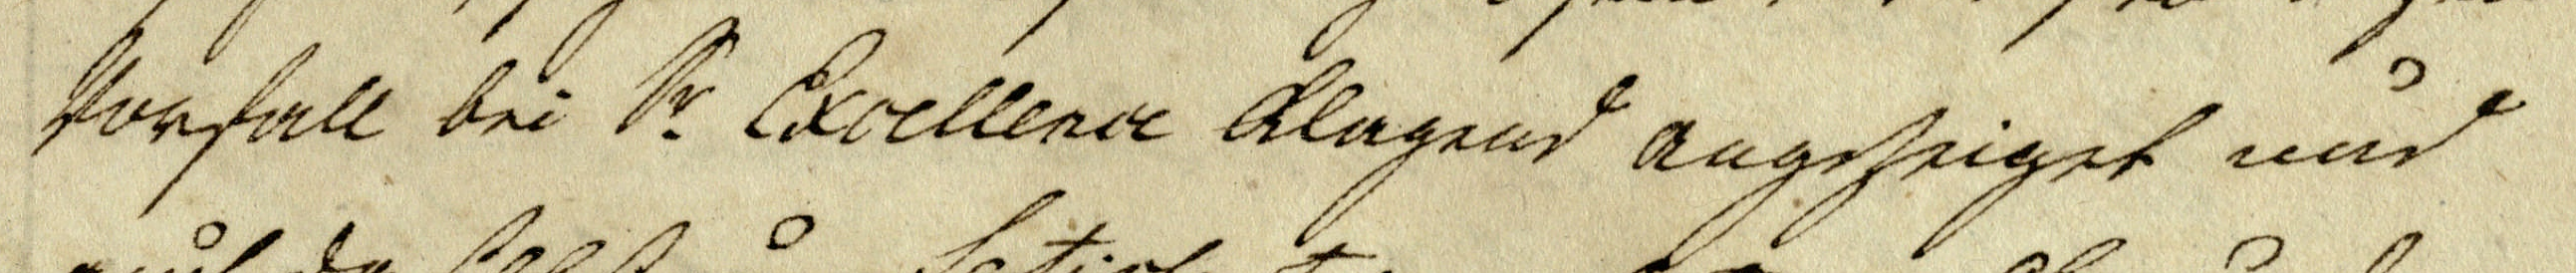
Vorfall bei Sr Excellence klagend angezeiget und
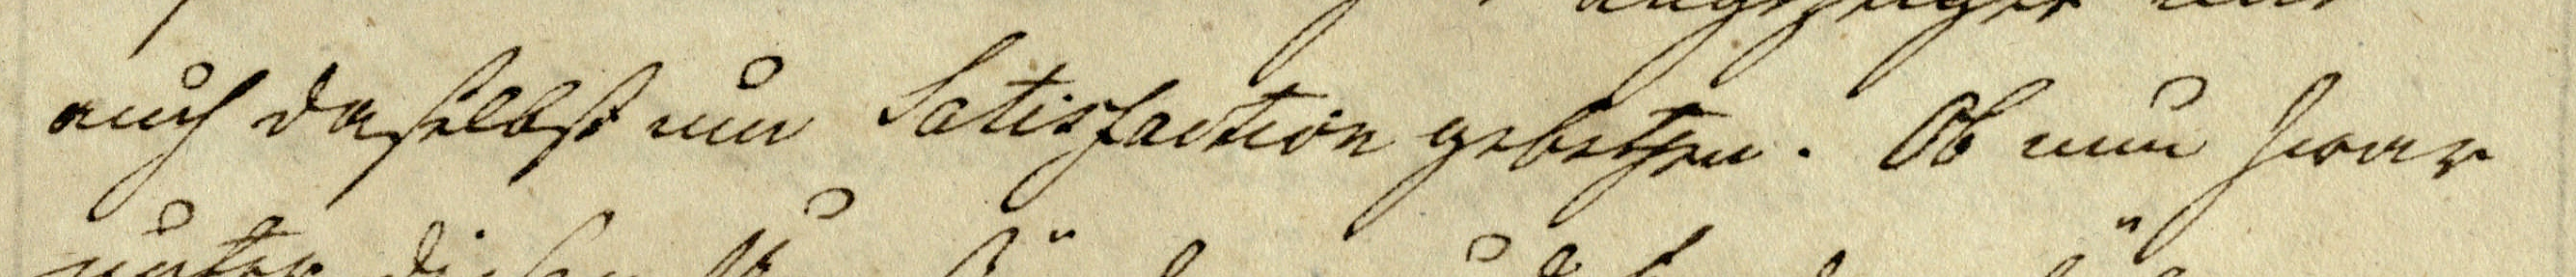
auch daselbst um Satisfaction gebethen. Ob nun zwar
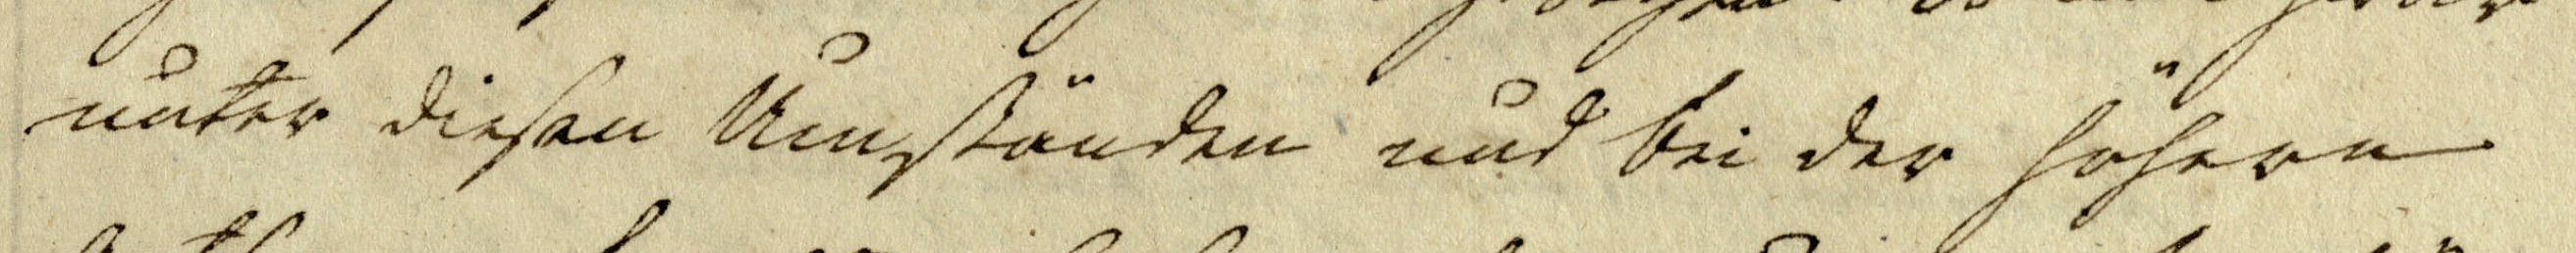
unter diesen Umständen und bei der höhern
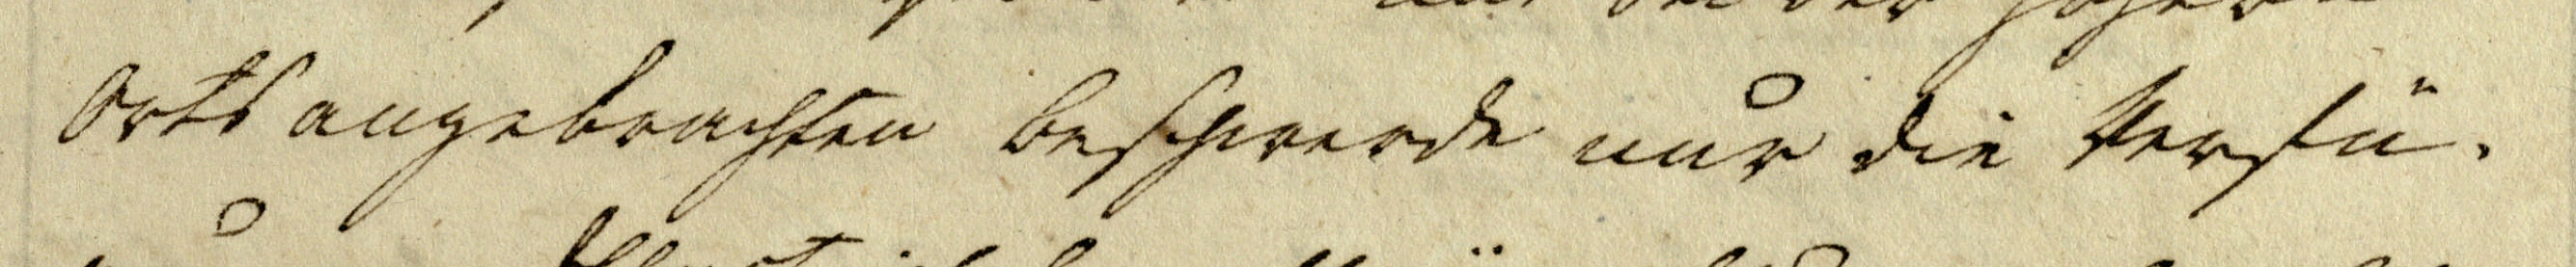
Orts angebrachten Beschwerde nur die Verfü¬
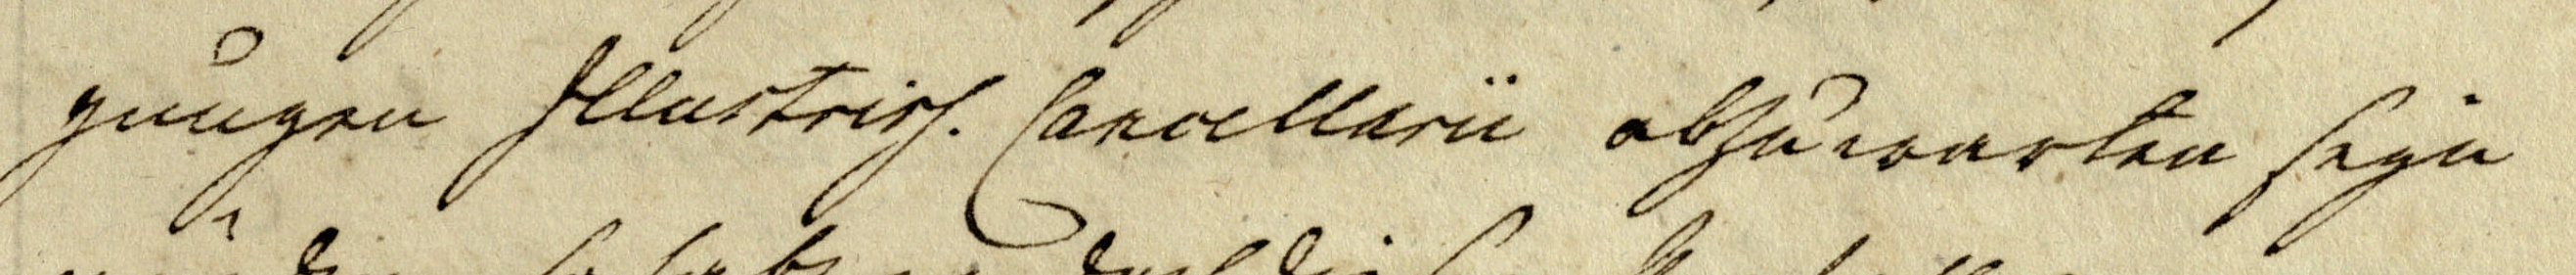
gungen Illustriss. Cancellarii abzuwarten seÿn
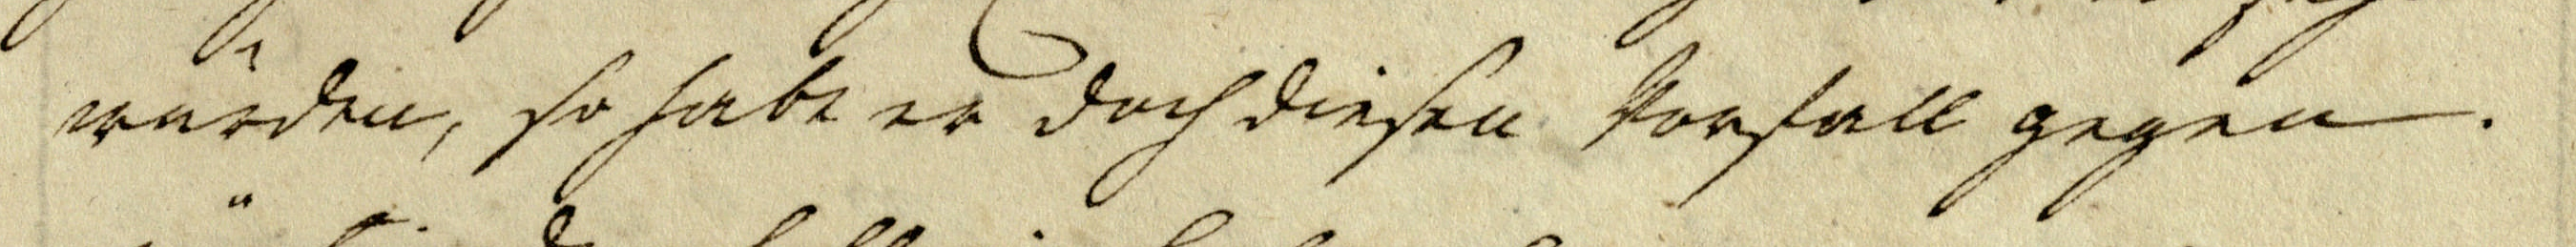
würden, so habe er doch diesen Vorfall gegen¬
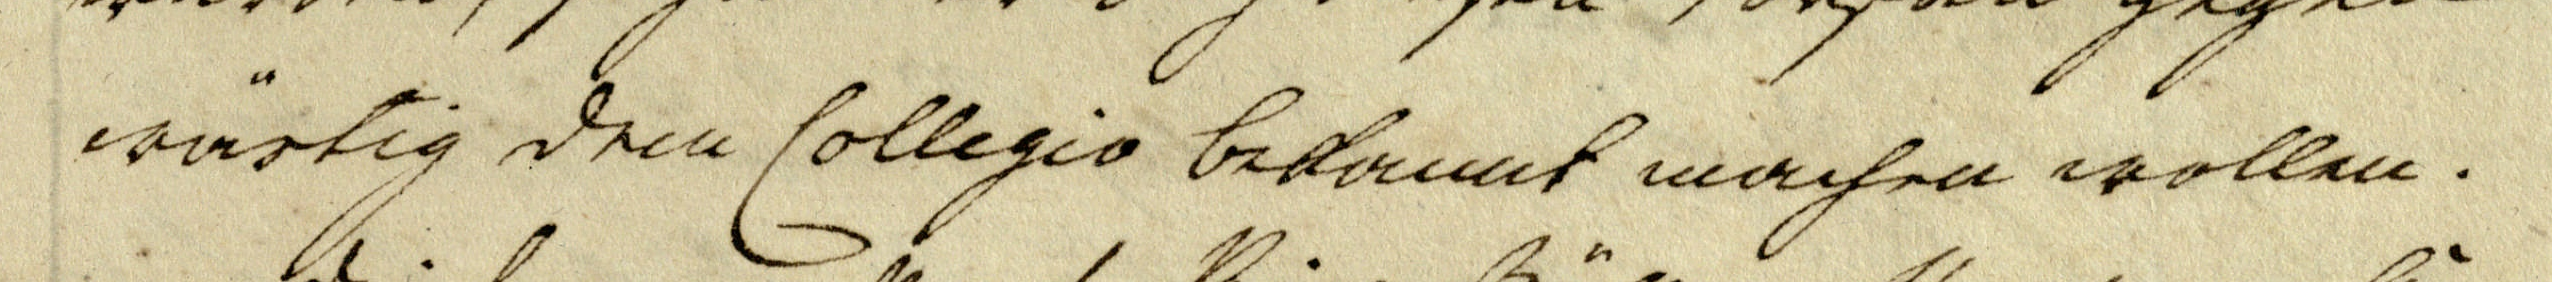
wärtig dem Collegio bekannt machen wollen.
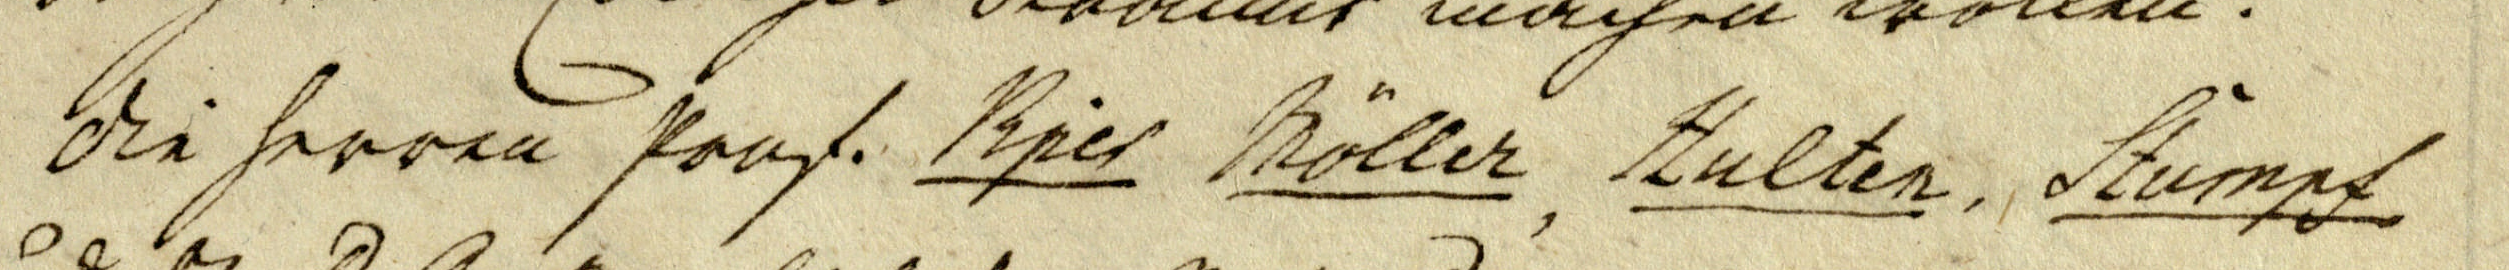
Die Herren Prof. Piper Möller Hulten, Stumpf
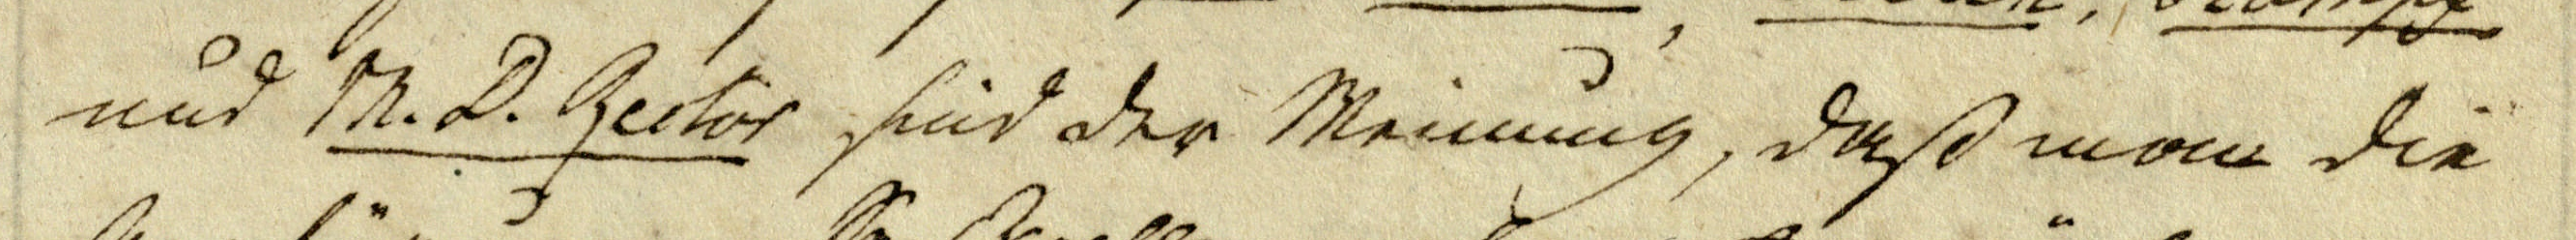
und M. D. Rector sind der Meinung, daß man die
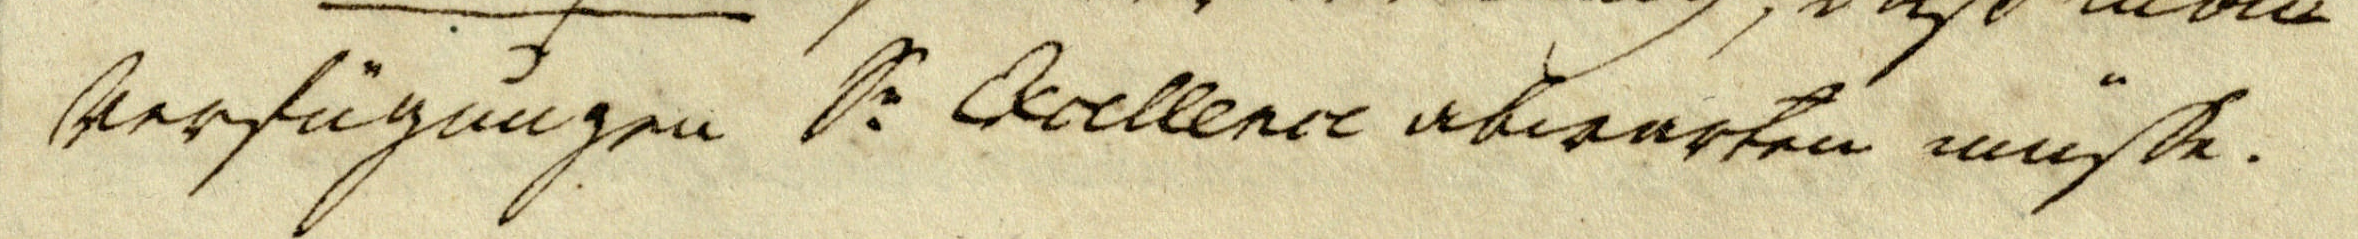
Verfügungen Sr Excellence abwarten müsse.
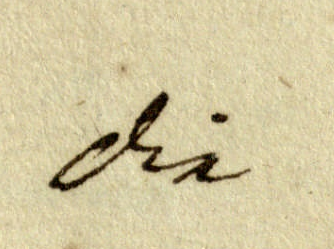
Die
